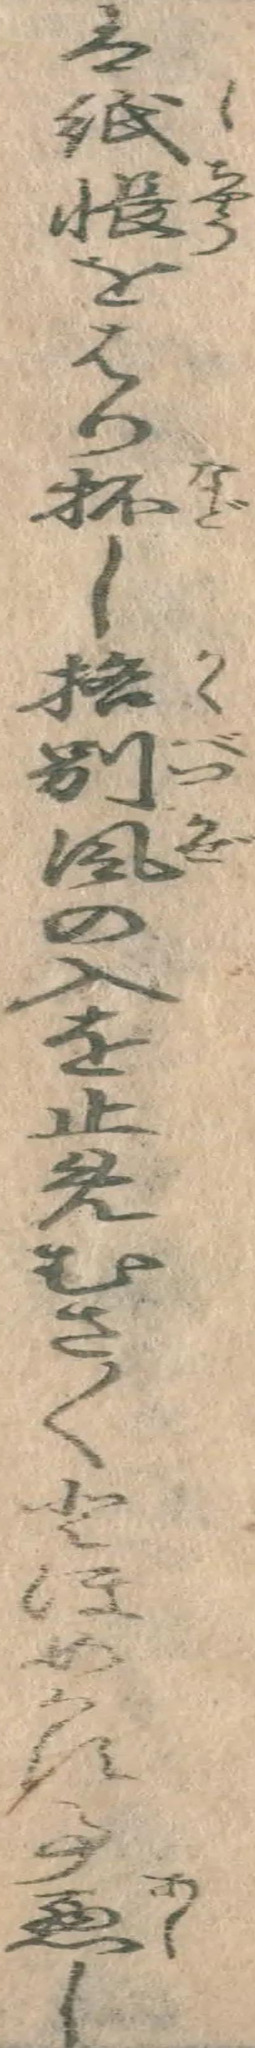は紙帳をはり抔し格別風の入を止めむさ〳〵とほめかす事悪し
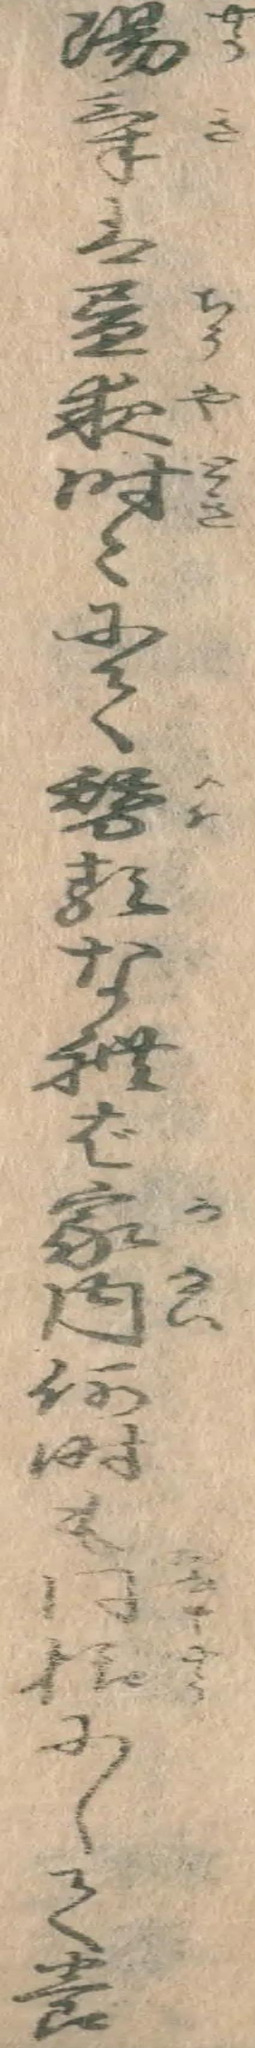陽気は昼夜時々にて替るなれば家内何時も同様にして養
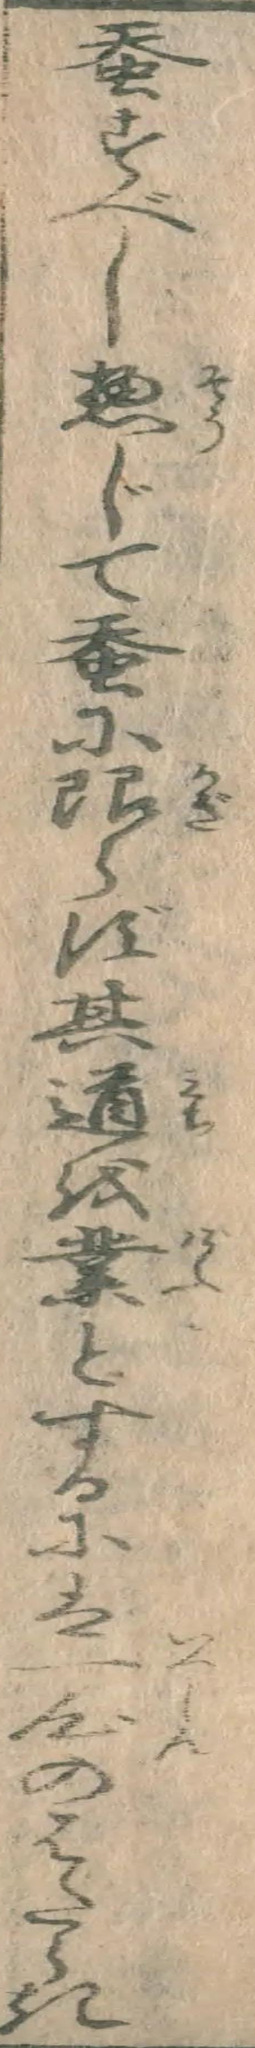蚕すべし惣じて蚕に限らず其道を業とするには一心のはたらき

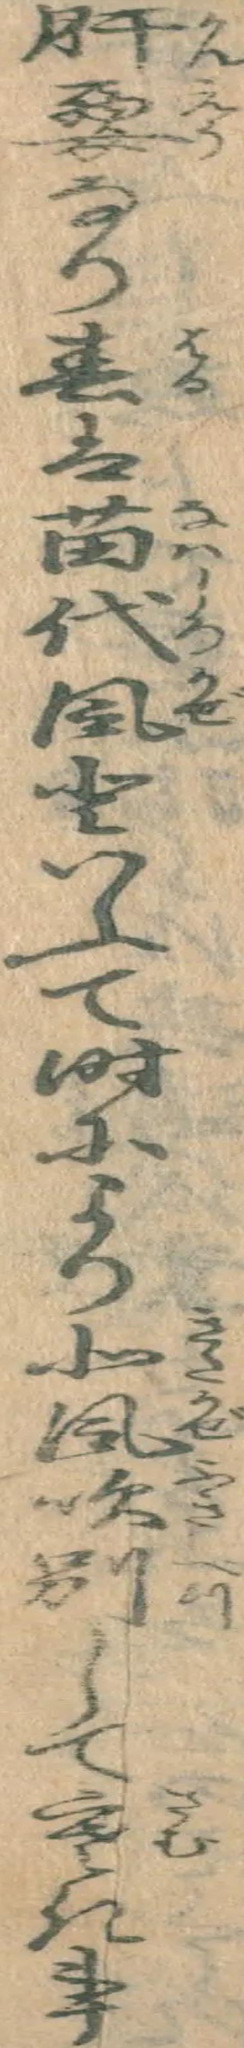肝要なり春は苗代風といふて時により北風吹別して寒き事
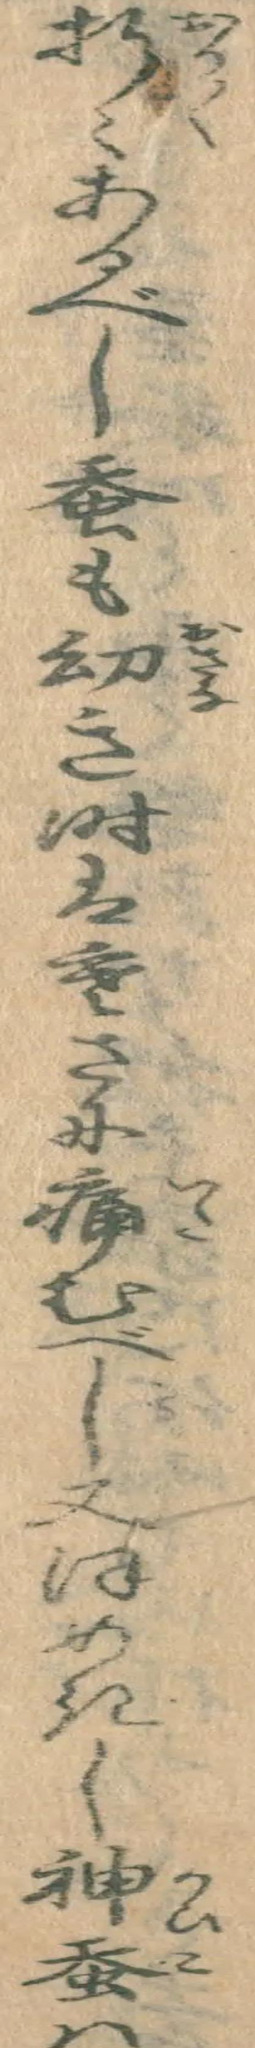折々あるべし蚕も幼き時は寒さに痛むべし又ほめきし神蚕は
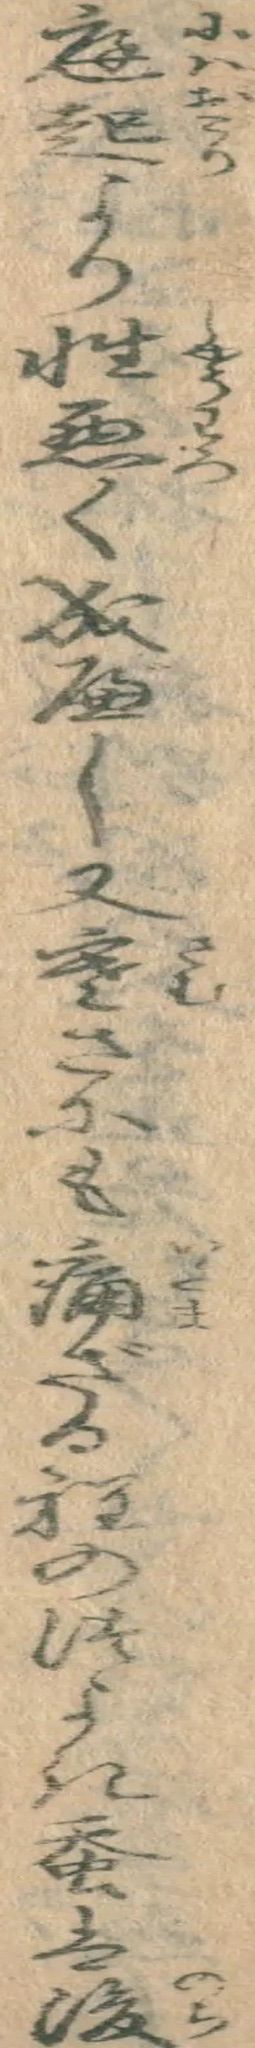庭起より性悪く成べし又寒さにも痛ざる程のつよき蚕は後
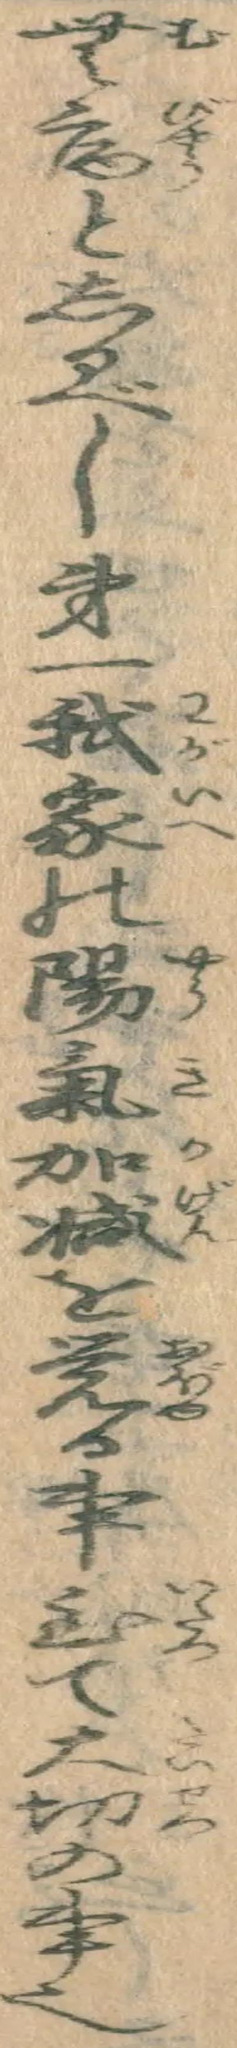無病としるべし第一我家の陽気加減を覚る事至て大切の事也
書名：養蚕秘録 3巻. [1]
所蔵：国立国会図書館 National Diet Library, JAPAN
